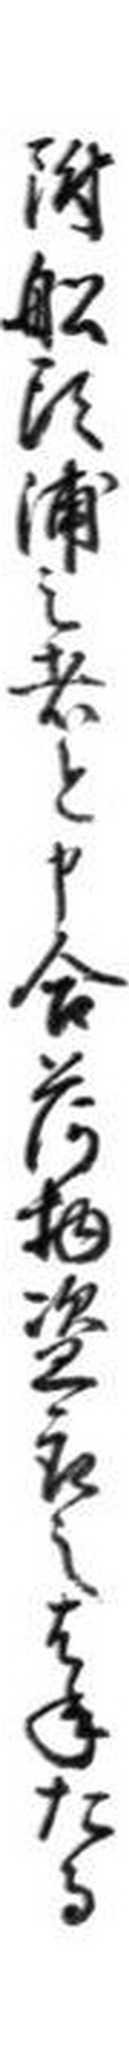附船頭之者と申合荷物盗取之はねたる
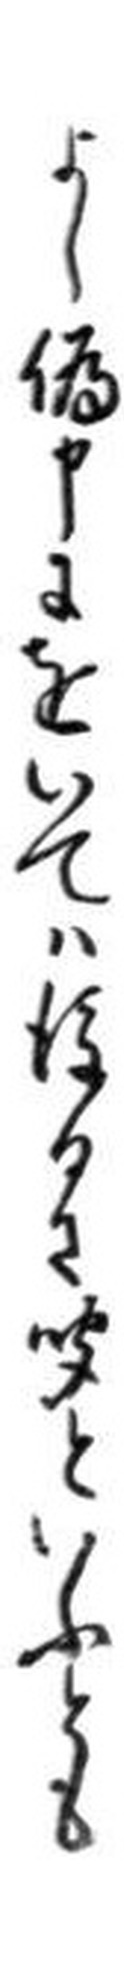よし偽申にをいてハ後日に聞といふとも
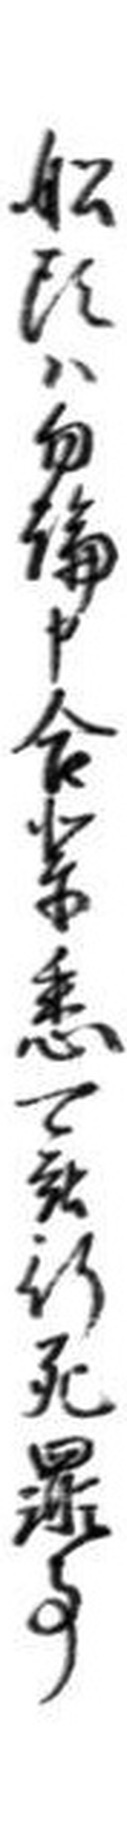船頭ハ勿論申合輩悉可被行死罪事
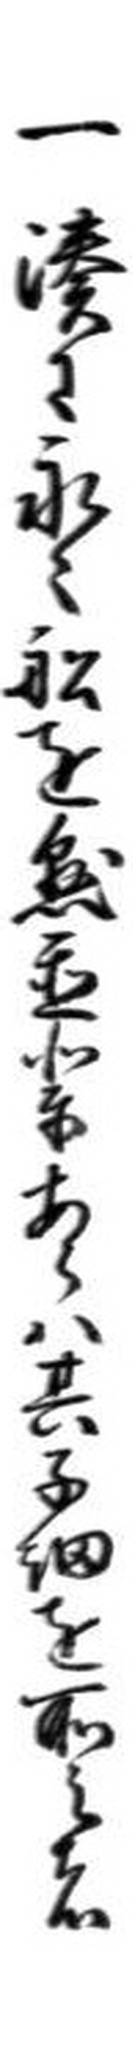一湊に永々船を懸置輩あらハ其子細を所之者
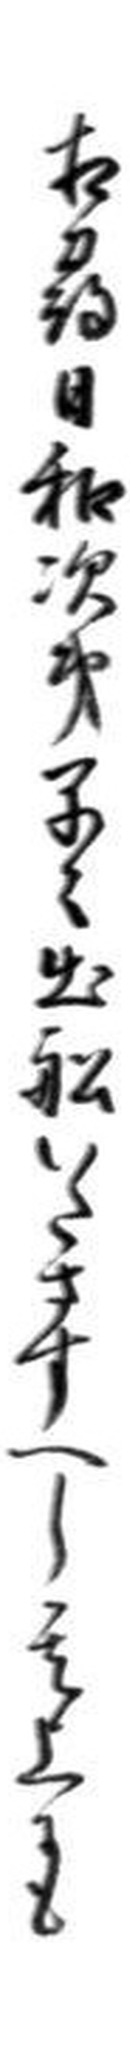相尋日和次第早々出船いたさすへし其上にも
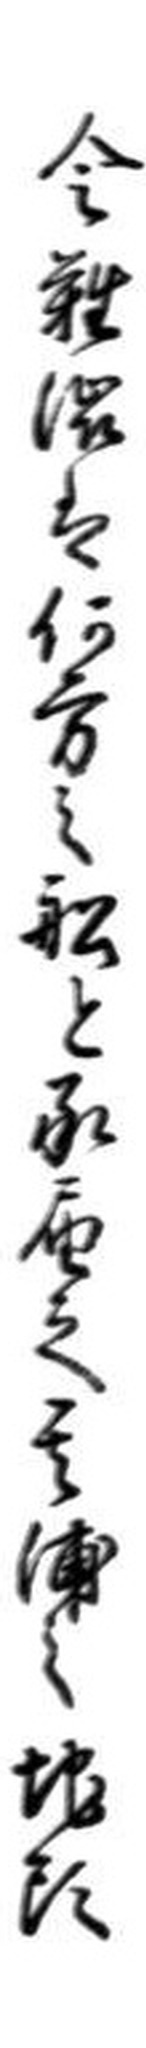令難渋は何方之船と承届之其浦之地頭
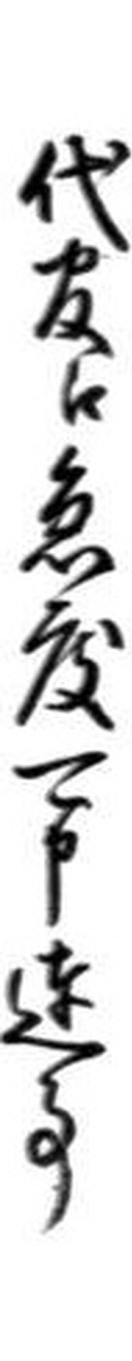代官江急度可申達事
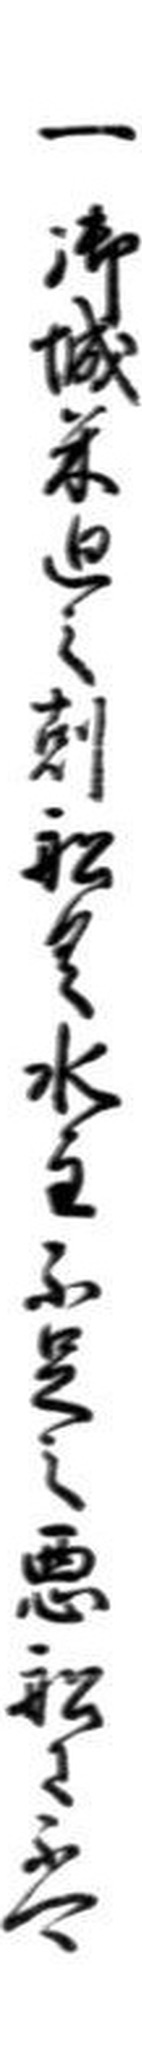一御城米廻之刻船具水主不足之悪船に不可
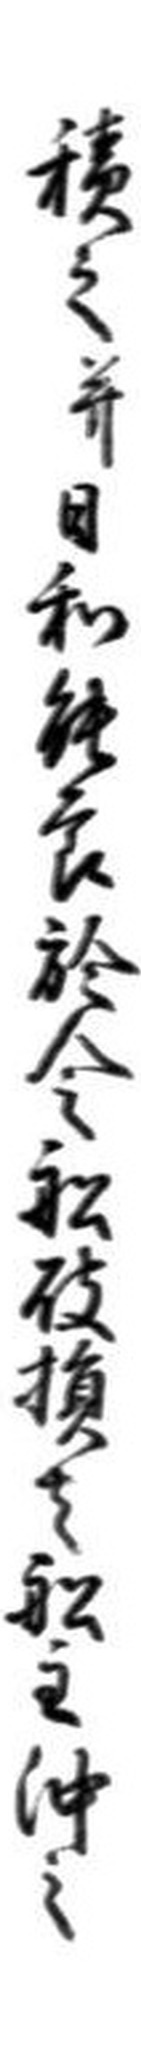積之并日和能節於令船破損者船主沖之
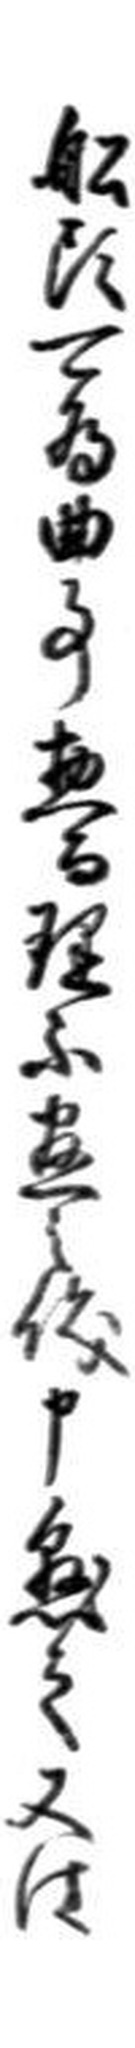船頭可為曲事惣而理不尽之儀申懸之又は
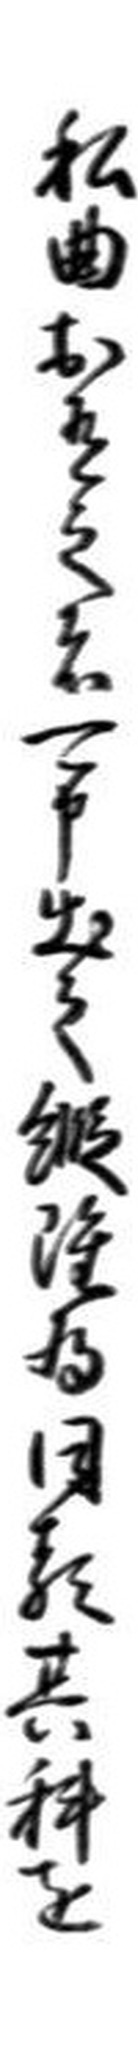私曲於有之者可申出之縦雖為同類其科を
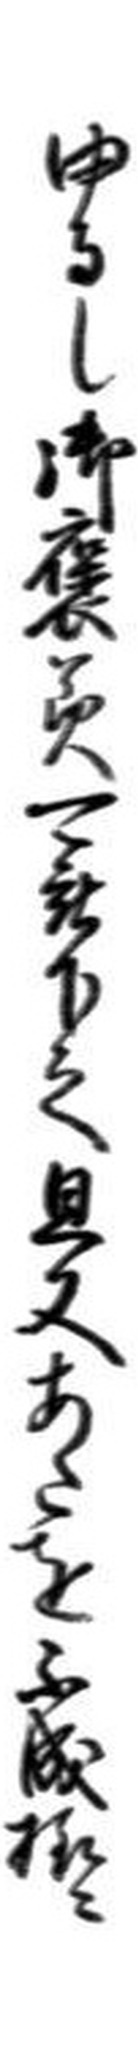ゆるし御褒美可被下之且又あたを不成様ニ
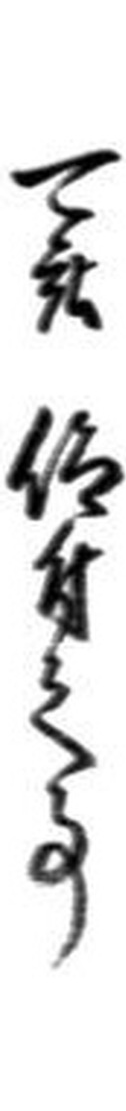可被仰付之事

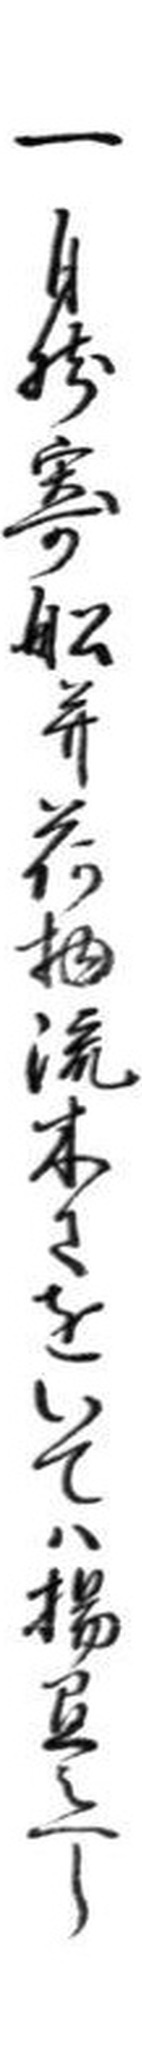一自然寄船并荷物流木にをいてハ揚置之へし
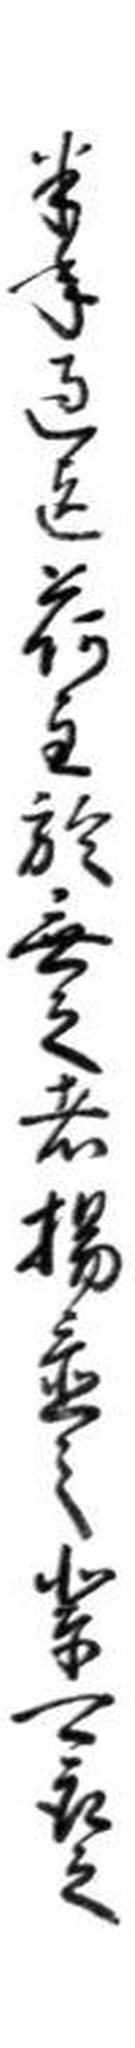半年過迄荷主於無之者揚置之輩可取之
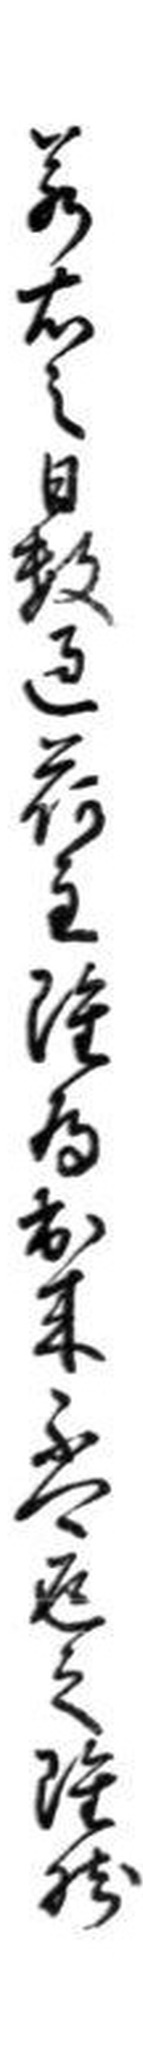若右之日数過荷主雖為出来不可返之雖然
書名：家譜 七 光通公 従寛文四年到同九年
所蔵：福井県文書館 Fukui Prefectural Archives
